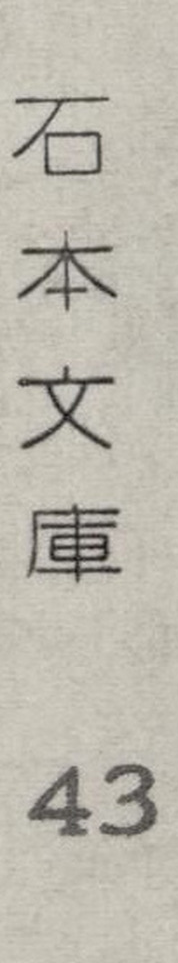石本文庫
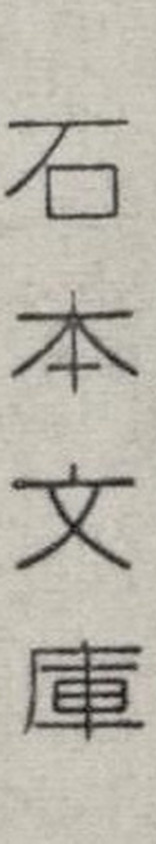石本文庫

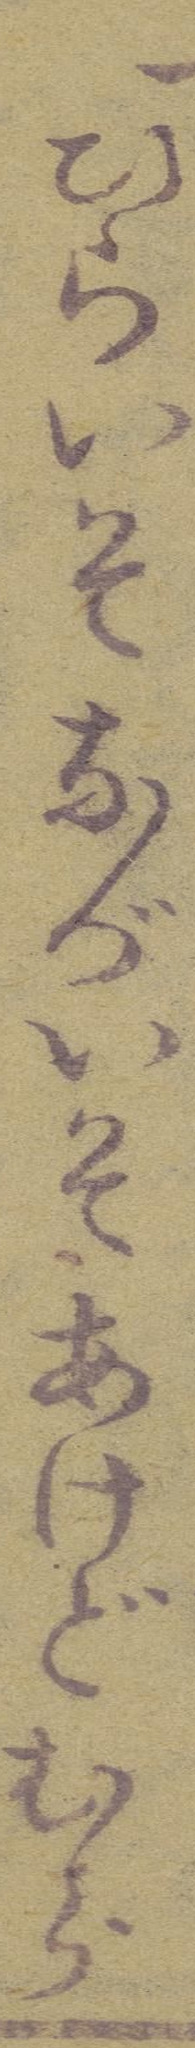ひらいそながいそあけどむら
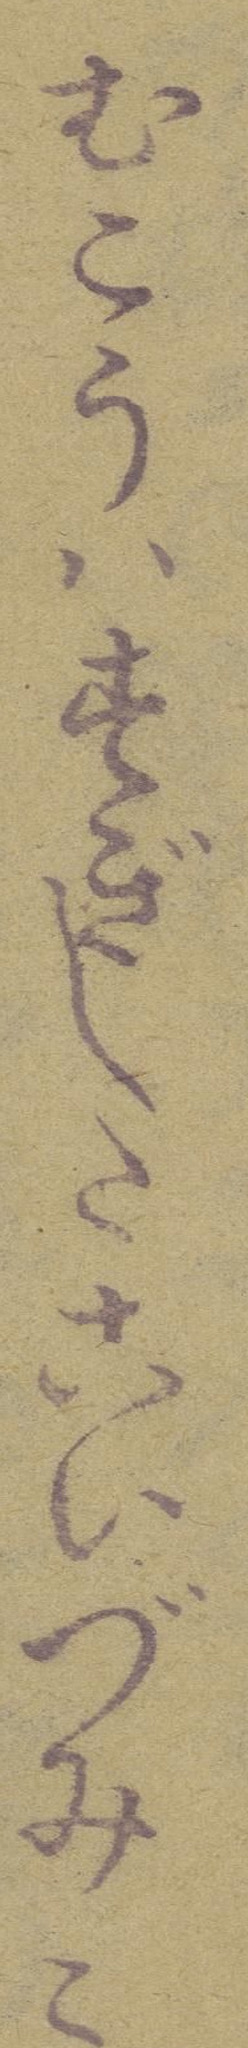むこうはすぎしたこいづみに

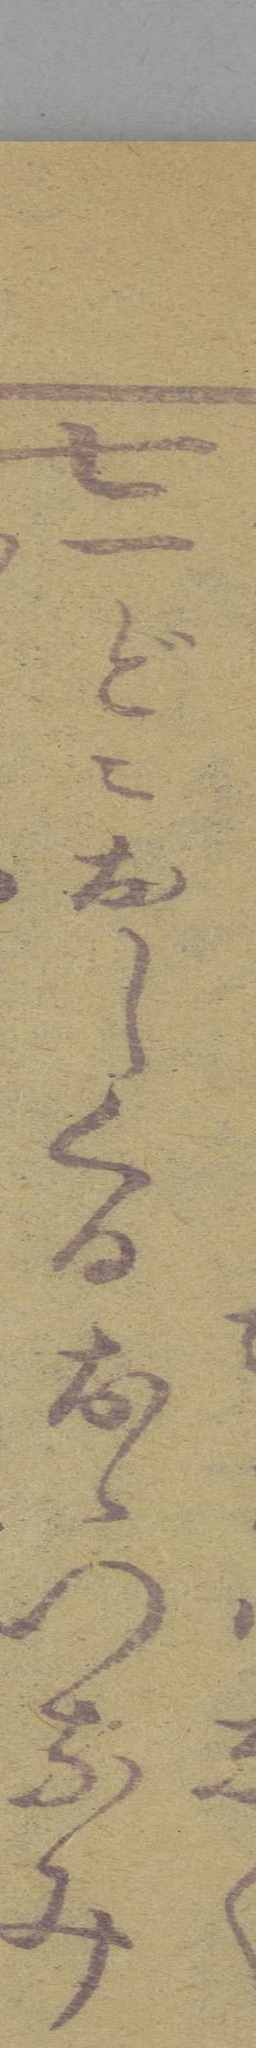七一どにおしくるおゝつなみ
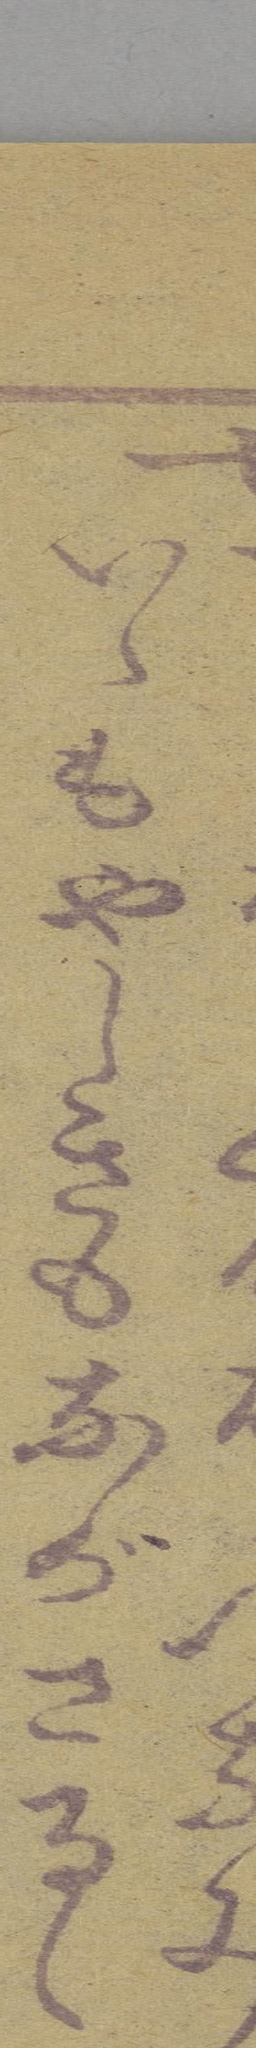いゝもやしきもながさるゝ
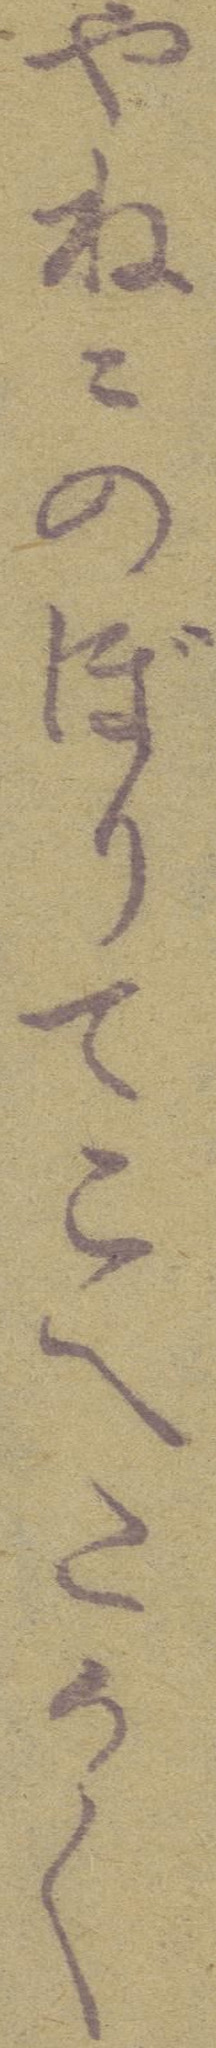やねにのぼりてこへたかく
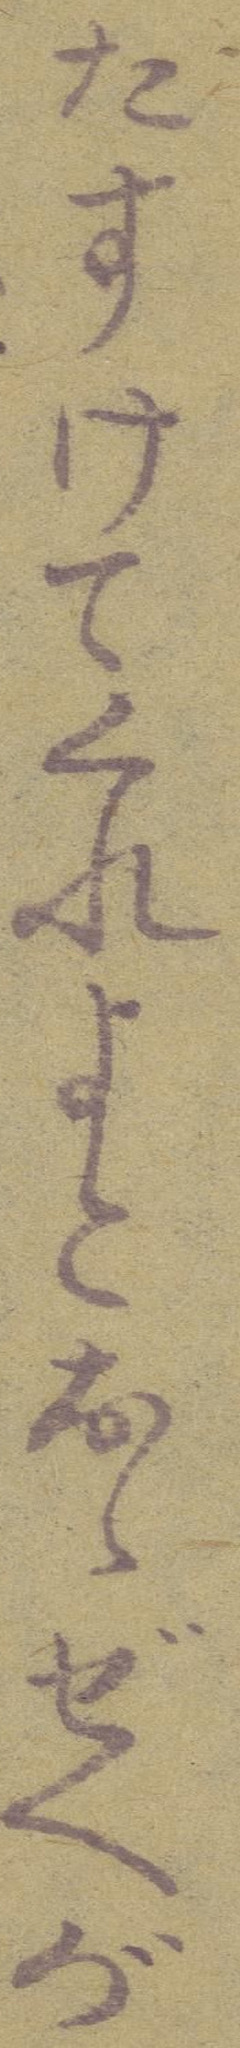八たすけてくれよとおゝぜへが
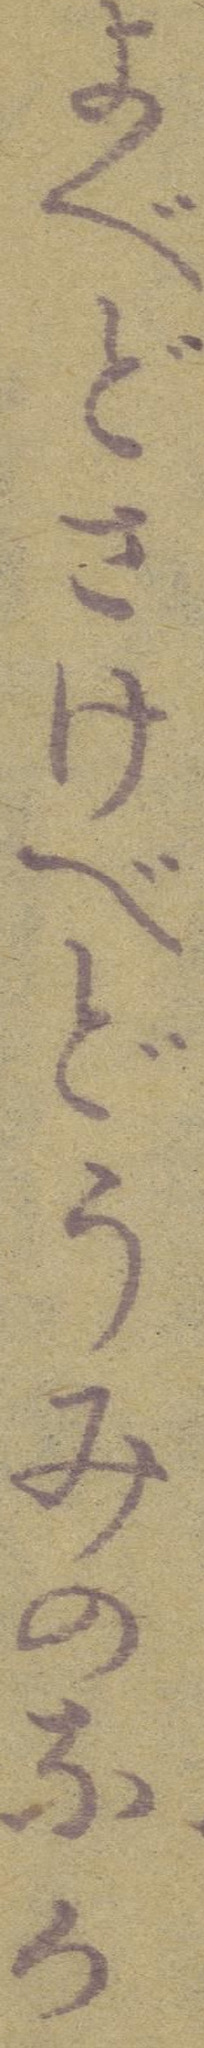よべどさけべどうみのなか
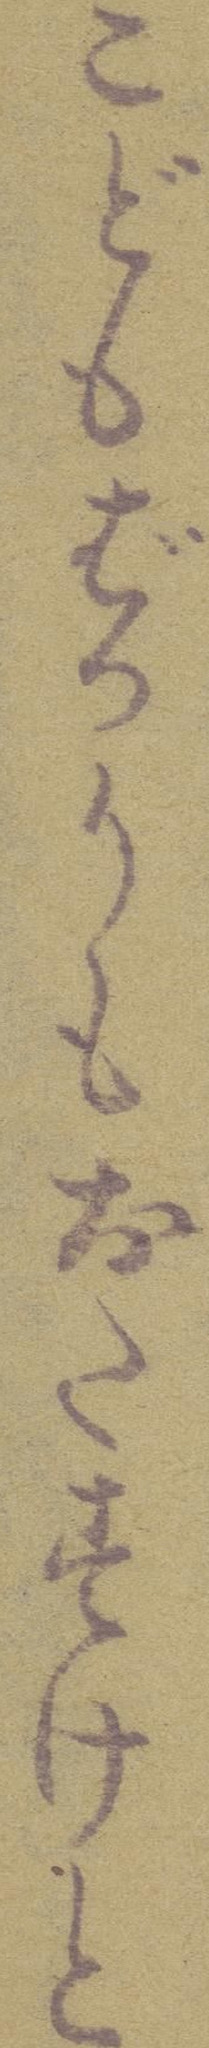こどもばかりもおたすけと

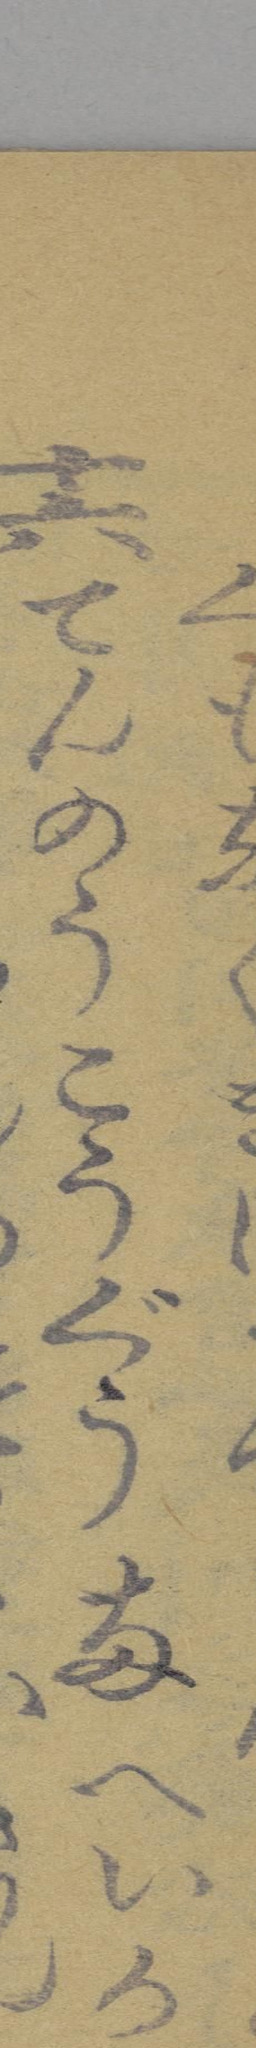十六てんのうこうぐう両へいか
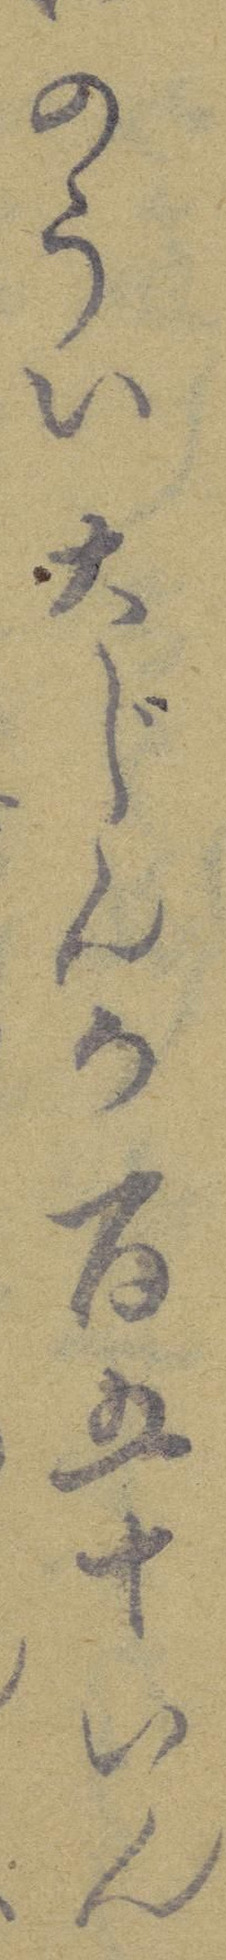いのうい大じんか百五十いん
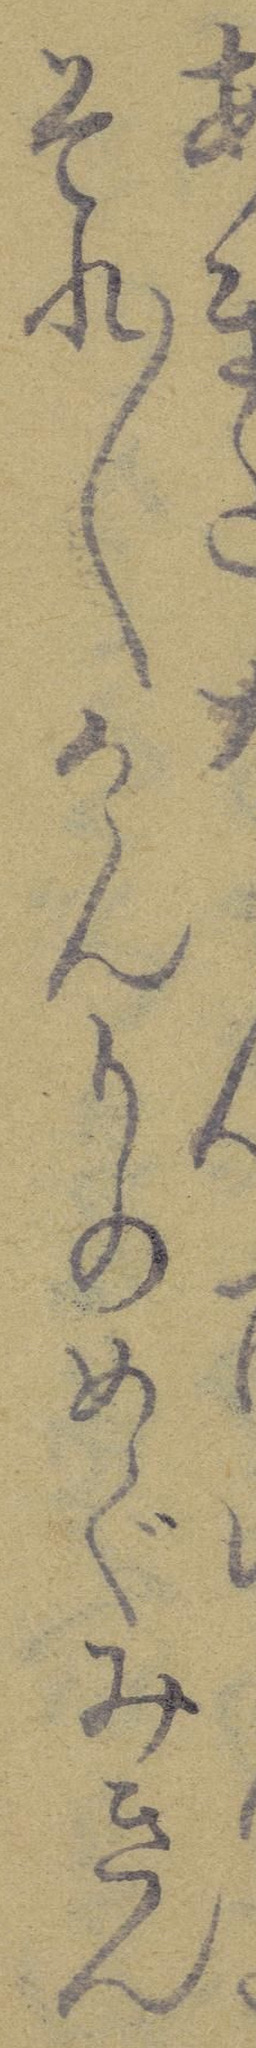それ〳〵かんりのめぐみきん
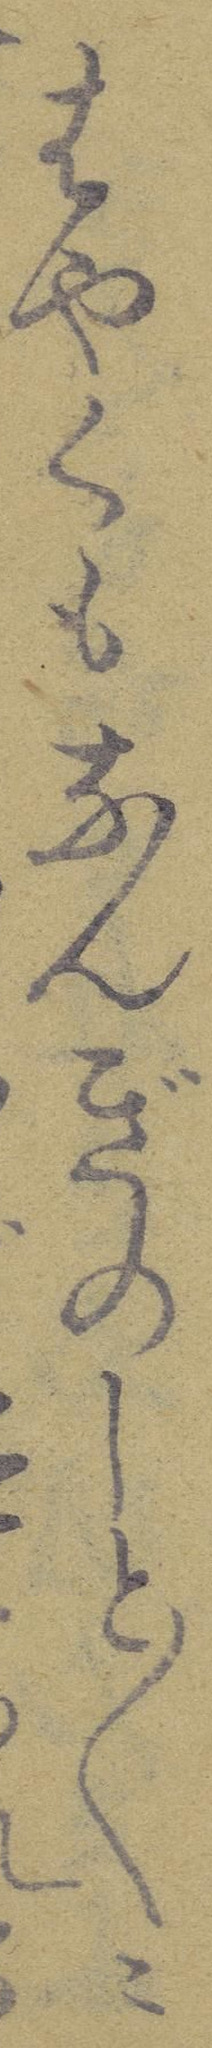はやくもなんぎのしと〳〵に
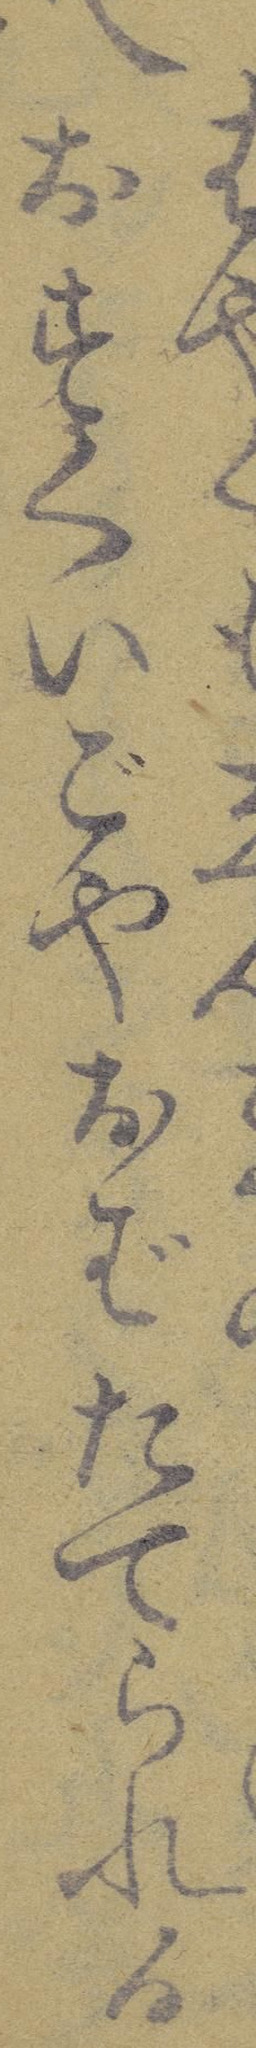十八おすくいごやおばたてられる
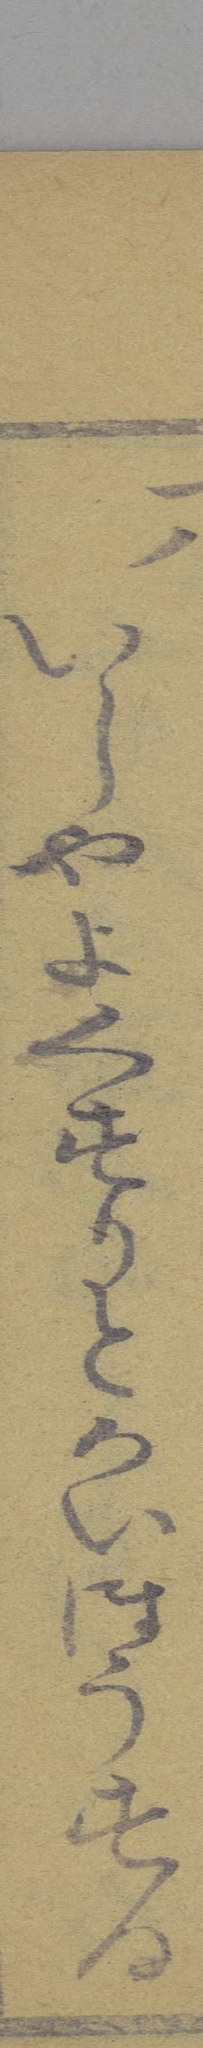いしやよくすりとかいほうする
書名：岩手ケン宮城青森海嘯しんぶん
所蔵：東京大学地震研究所図書室 Earthquake Research Institute Library, The University of Tokyo, JAPAN
